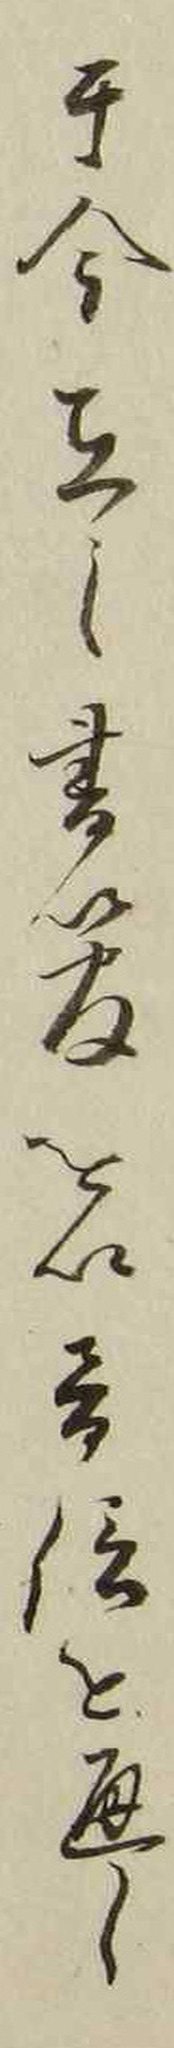于今在之書簡を以音信を通し
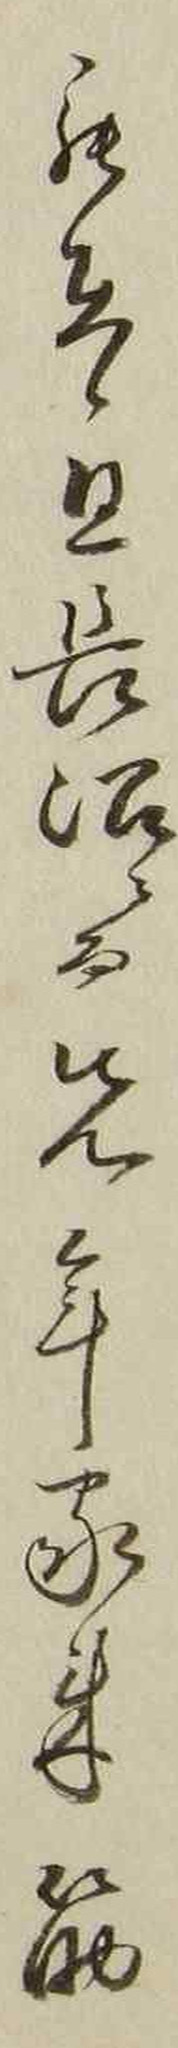罷在候且長沼ニ而先年家来筋
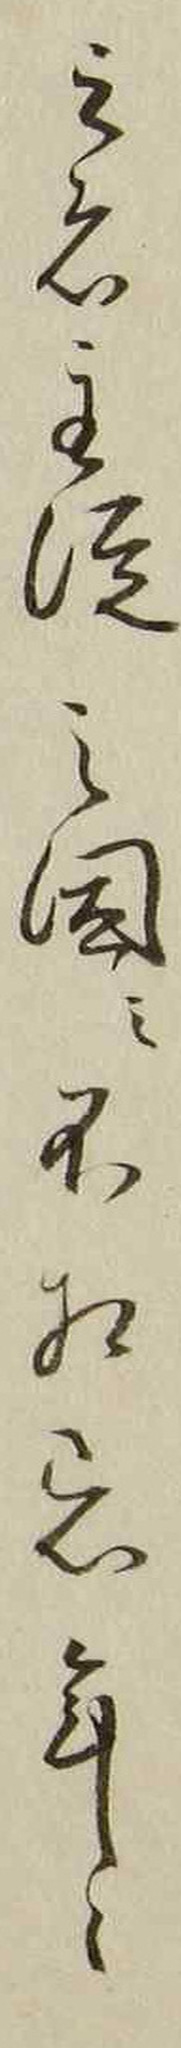之者主従之因ミ不相忘年々
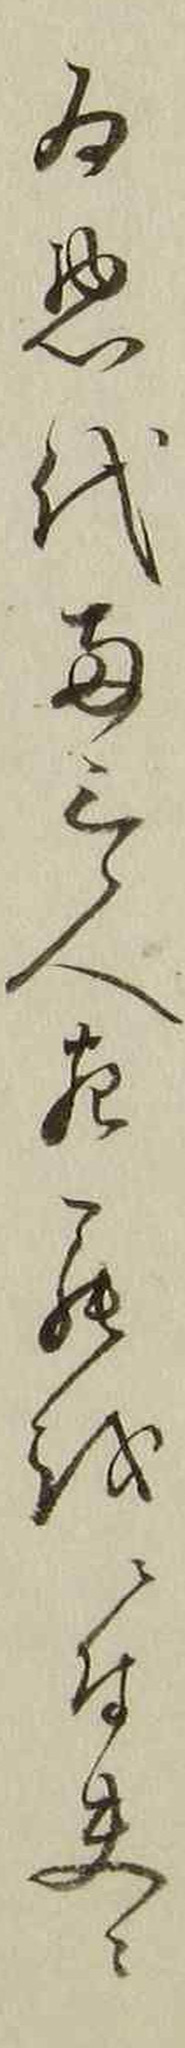為惣代両三人宛罷越ニ付夫々
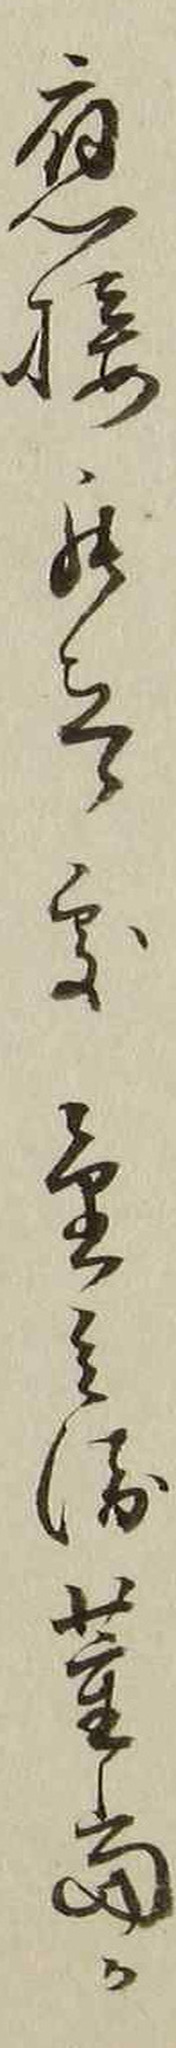応接罷在候処金兵衛董当か
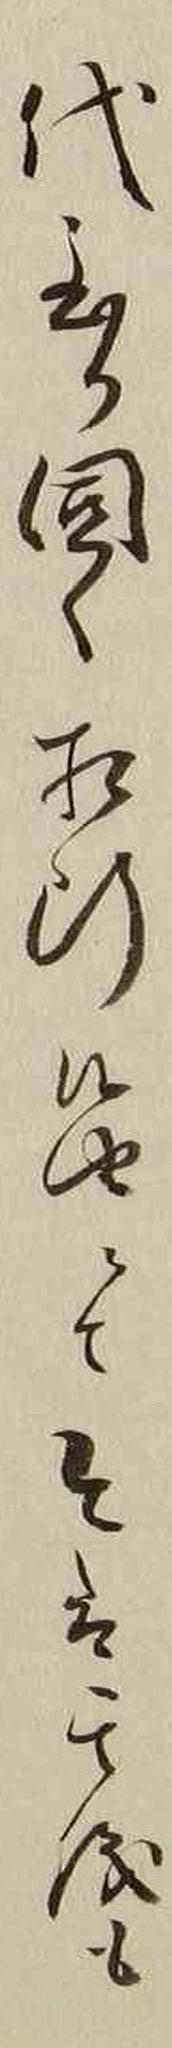代至り固く相断候由ニて今は其儀も
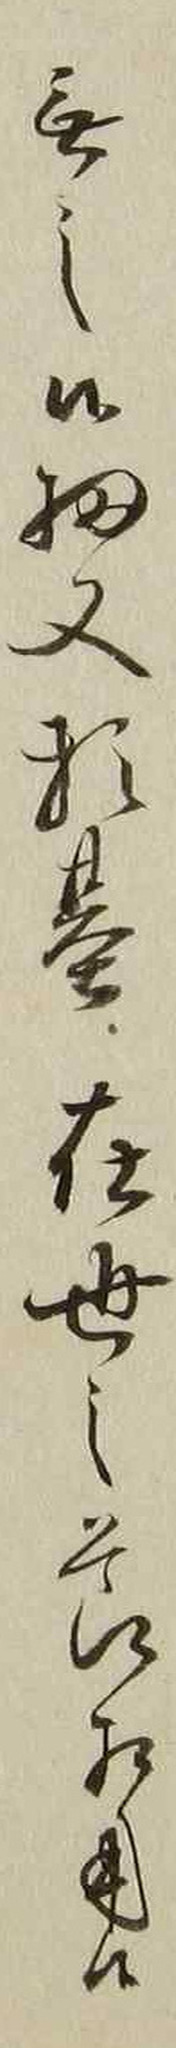無之候扨又頼基在世之節相用候
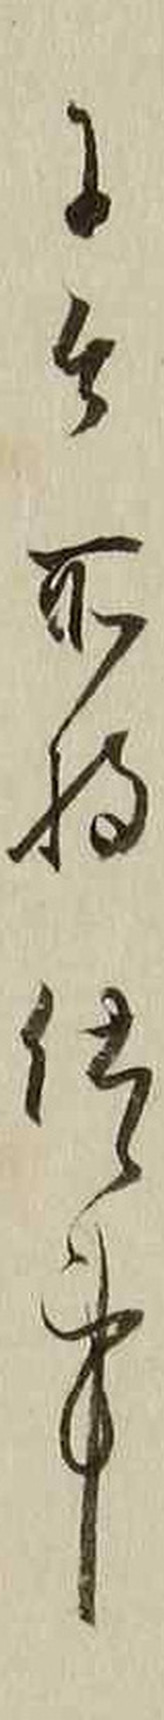于今所持仕候事
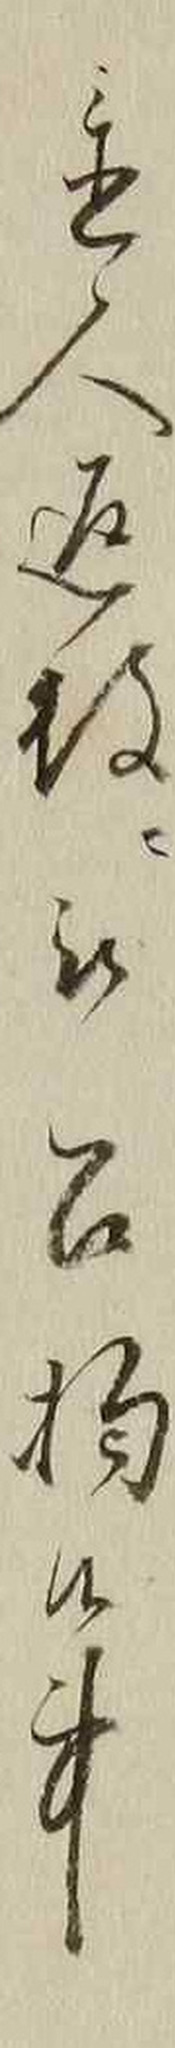置人返役ニ被召抱候事
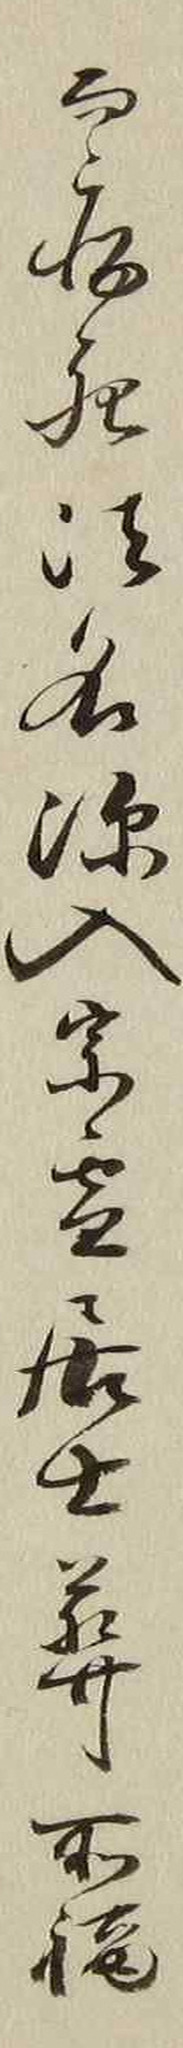而病死法名源入宗雪居士葬所福
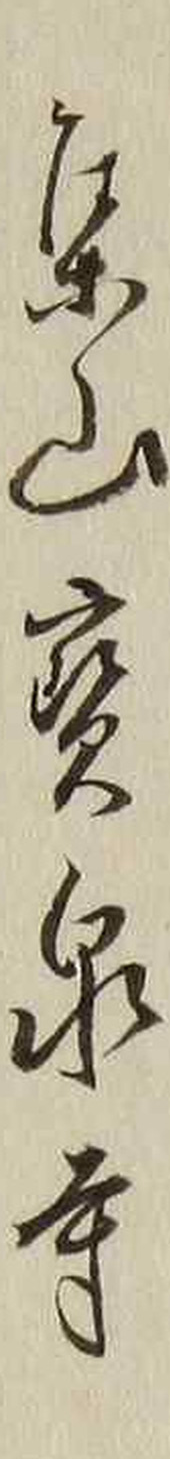集山宝泉寺
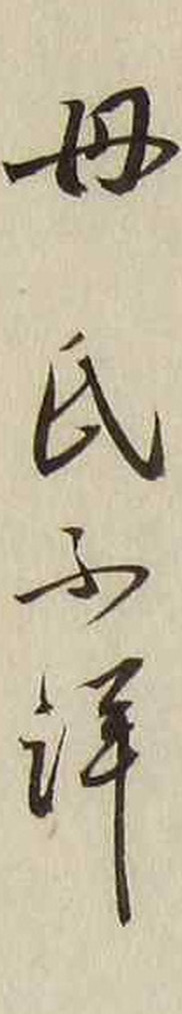母氏不詳

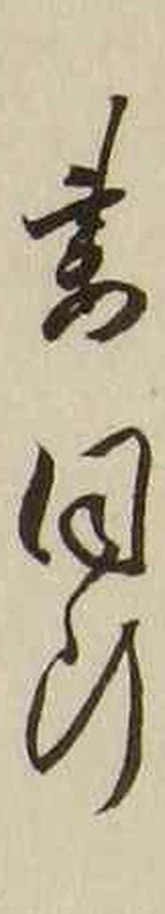妻同断
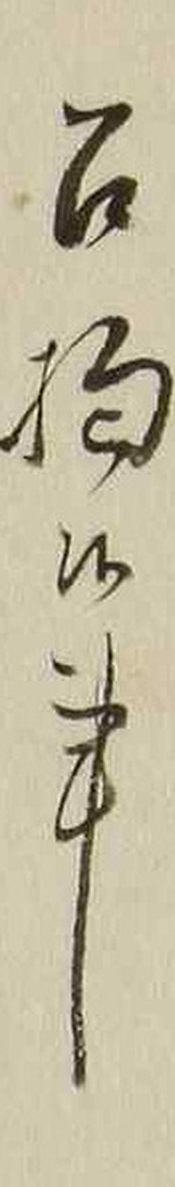召抱候事
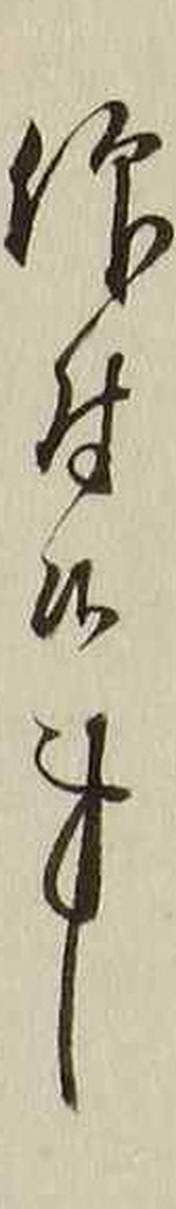仰付候事
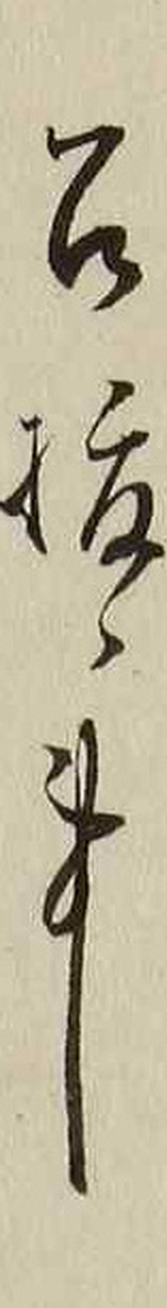召抱候事
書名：諸士系譜　巻之52　に之部3
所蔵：会津若松市立会津図書館
